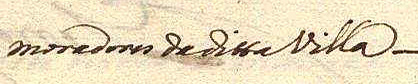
moradores da ditta Villa ‒
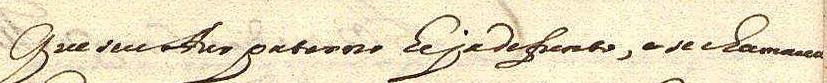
Que seu Auo paterno he ja defunto, e se chamaua
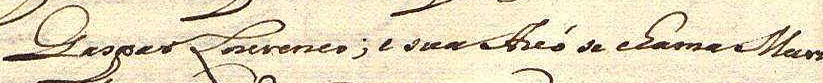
Gaspar Lourenco; e sua Auó se chama Mari_
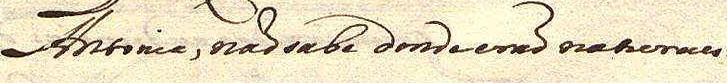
Antonia, naõ sabe donde eraõ naturaes.
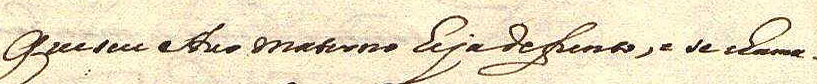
Que seu Auo materno he ja defunto, e se chama
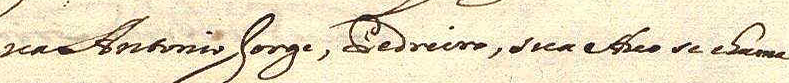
ua Antonio Jorge, Pedreiro, sua Auo se chama
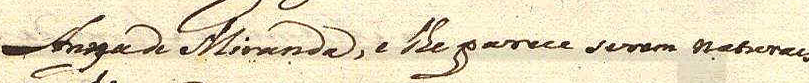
Anna de Miranda, e lhe parece serem naturaes
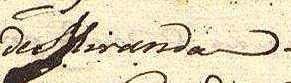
de Miranda
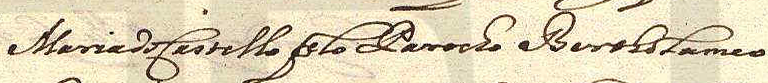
Maria do Castello pelo Parocho Bartholomeo
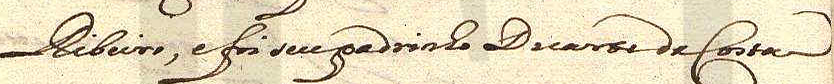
Ribeiro, e foi seu padrinho Duarte da Costa
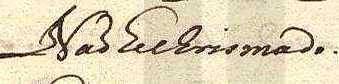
Naõ he chrismado.
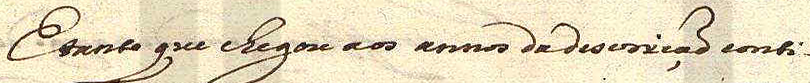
E tanto que chegou aos annos da descriçaõ conti
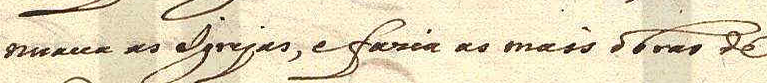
nuaua as Igrejas, e fazia as mais obras de
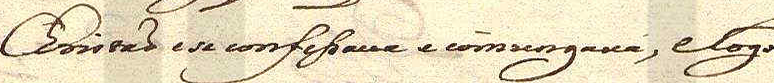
Christaõ e se confessaua e com̄ungaua, e logo
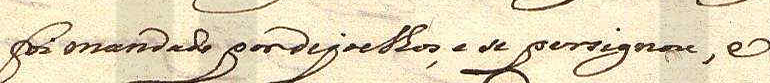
foi mandado por de joelhos, e se persignou, e
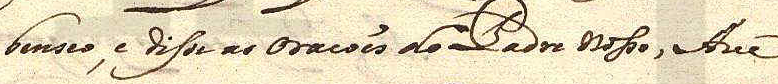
benseo, e disse as oracoes̄ do Padre nosso, Aue
